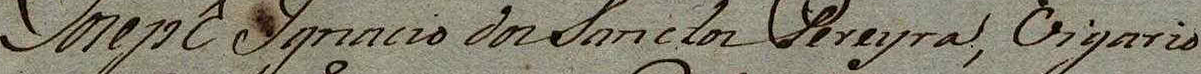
Ioseph Ignacio dos Sanctos Pereyra, Vigario
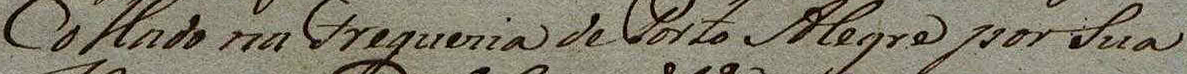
Collado na Freguezia de Porto Alegre por sua
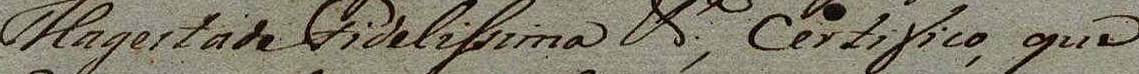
Magestade Fidelissima &.a, Certifico, que
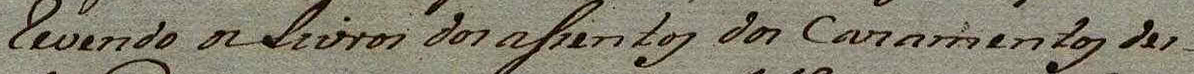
Revendo os livros dos assentos dos cazamentos des
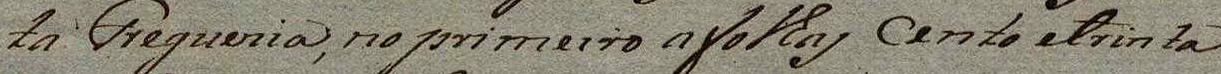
ta Freguezia, no primeiro a folhas cento e trinta
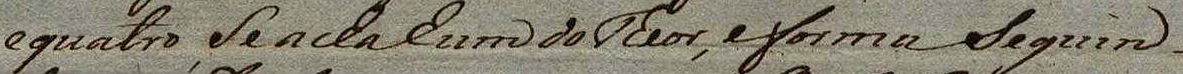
e quatro, se acha hum do theor, e forma Seguin
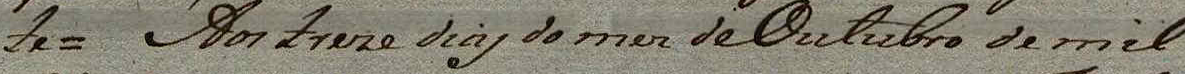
te = Aos treze dias do mez de Outubro de mil
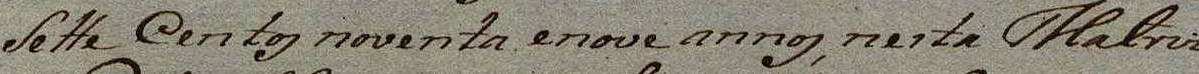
setteCentos e noventa e nove annos, nesta Matriz
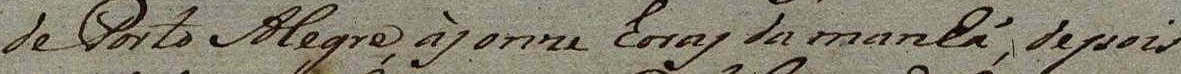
de Porto Alegre, às onze horas da manhã, depois
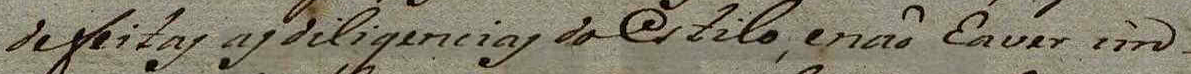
de feitas as diligencias do Estilo, e naõ haver im
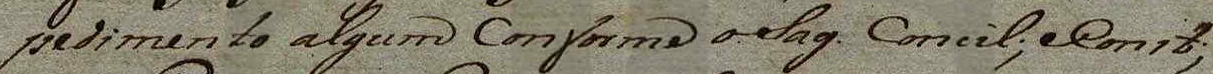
pedimento algum conforme o Sag. Concil; e Const;
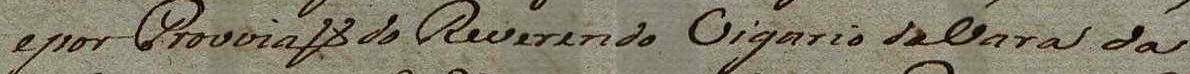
e por Provisaõ do Reverendo Vigario da Vara da
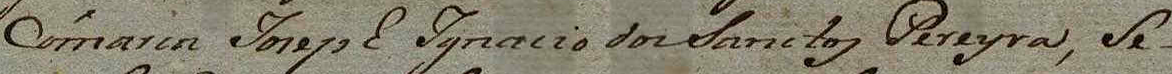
Comarca Iozeph Ignacio dos Sanctos Pereyra, se
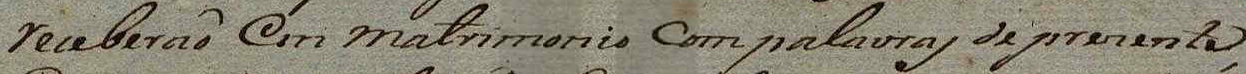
receberaõ Em matrimonio com palavras de prezente,
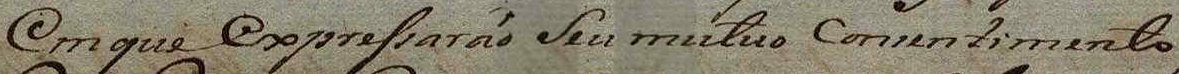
Em que Expressaraõ seu mutuo consentimento,
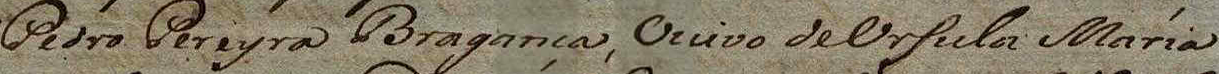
Pedro Pereyra Bragança, Viuvo de Ursula Maria
